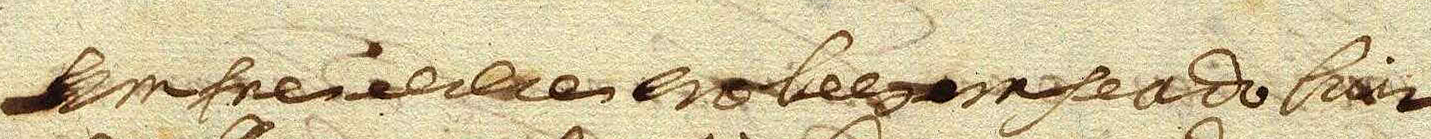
Emtre e Elle E o lesemseado luiz
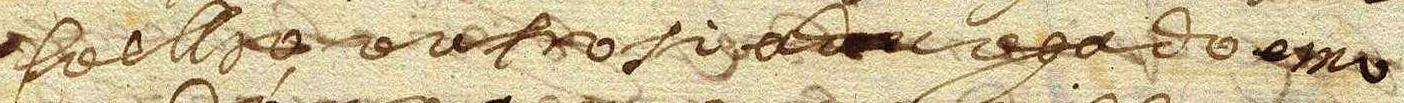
Coelho, outrosi aduogado e mo
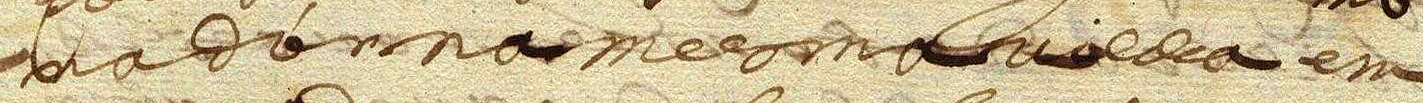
rador na mesma uilla em
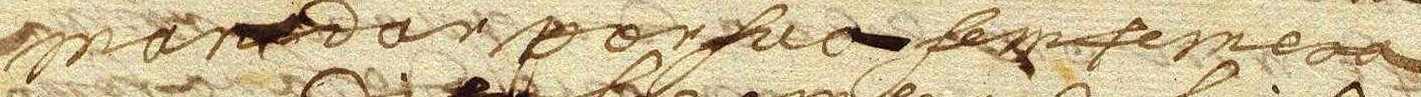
mandar por sua semtemsa
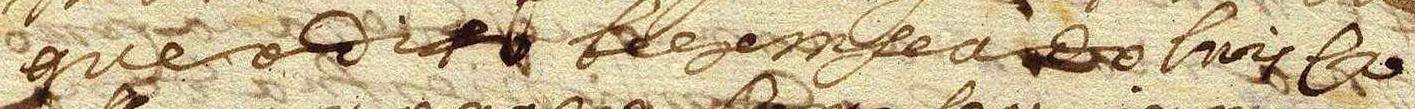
que o ditto lesemseado luis Co
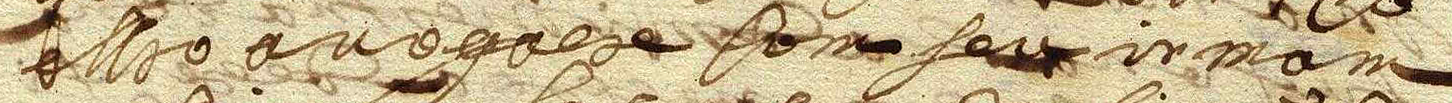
elho auogase Com seu irmam
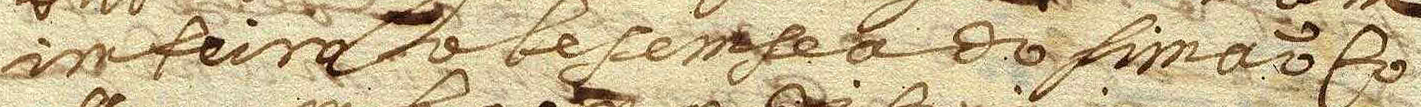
imteiro o lesemseado simaõ Co
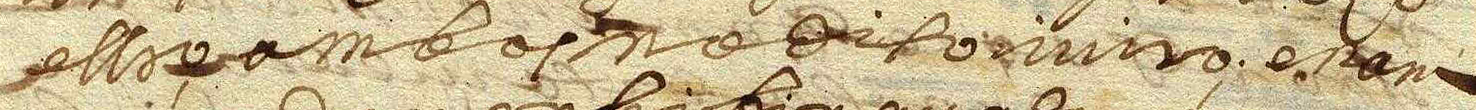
elho, ambos no dito iuizo, e nam
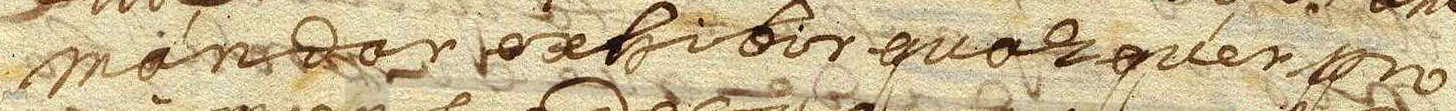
mandar exhibir qualquer pro
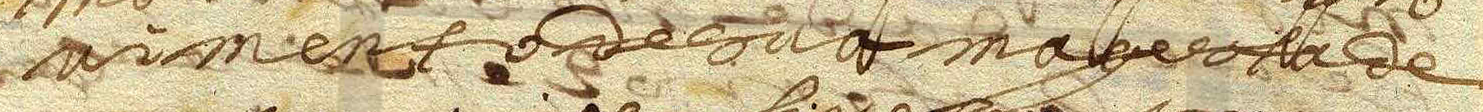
uimento de sua magestade
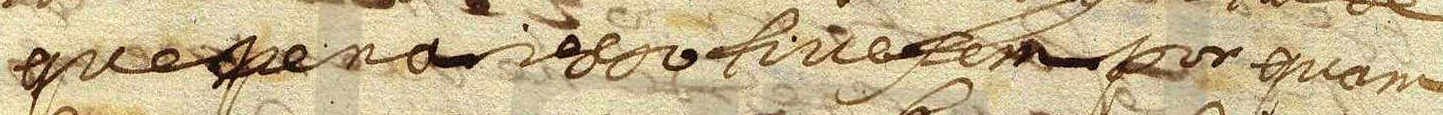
que pera isso tiuesem por quam
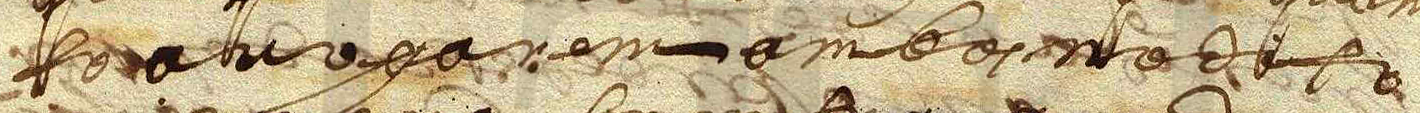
to auogarem ambos no dito
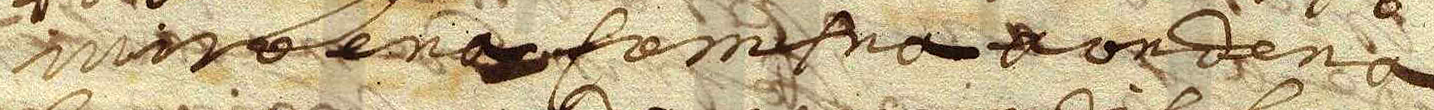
iuizo era Comtra a ordena
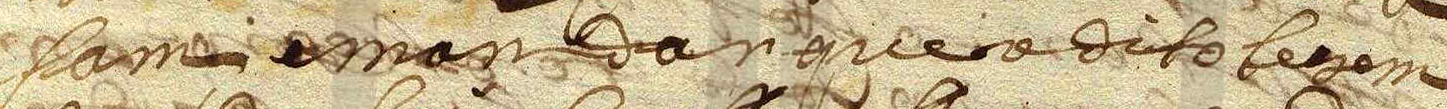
sam e mandar que o dito lesem
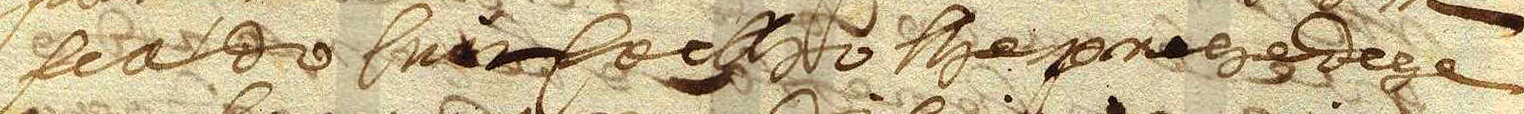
seado luiz Coelho lhe presedese
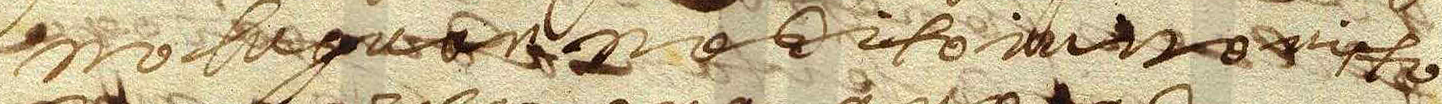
no luguar no dito iuizo uisto
